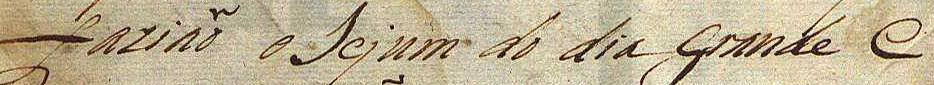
faziaõ o Iejum do dia grande e
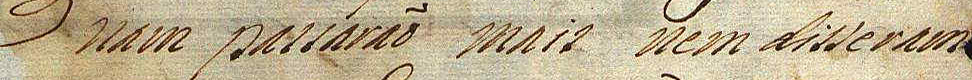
nam passaraõ mais nem disseram
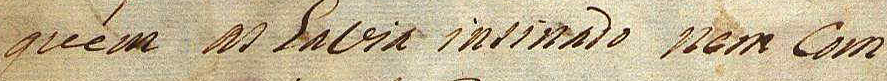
quem as havia insinado nem com
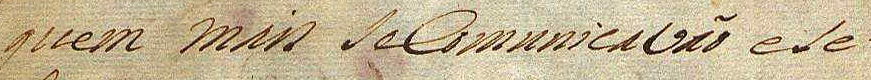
quem mais se comunicavaõ e se
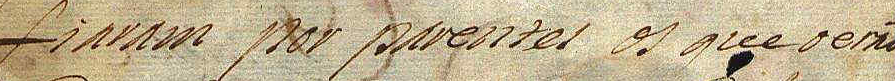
fiaram por parentes os que o erão
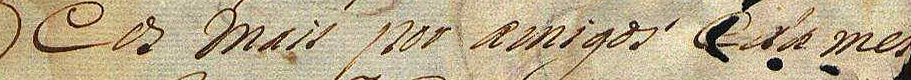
e os mais por amigos e da mes
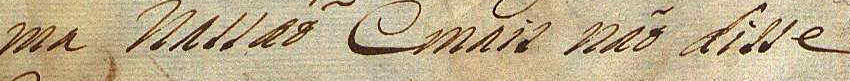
ma nassaõ e maiz naõ disse
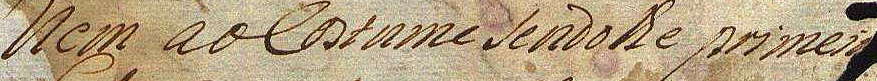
nem ao costume sendolhe primei_
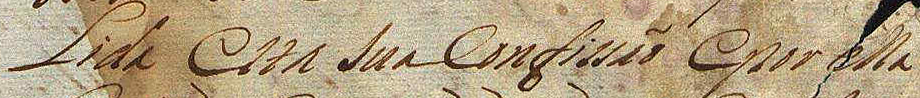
Lida esta sua confissaõ e por ella
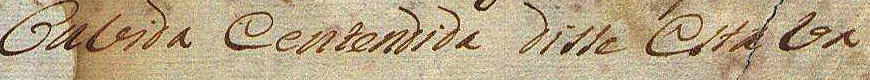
Ouvida e entendida disse estava
